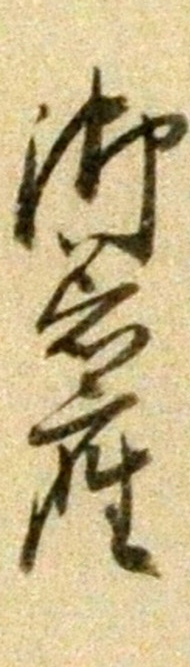御着座
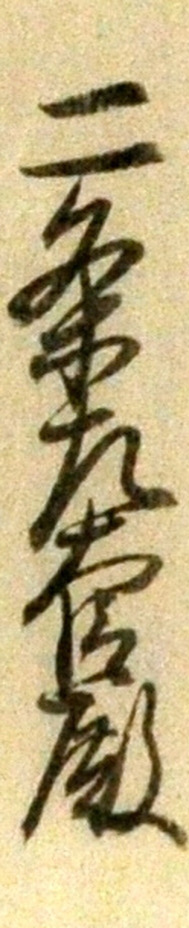二条左大臣殿
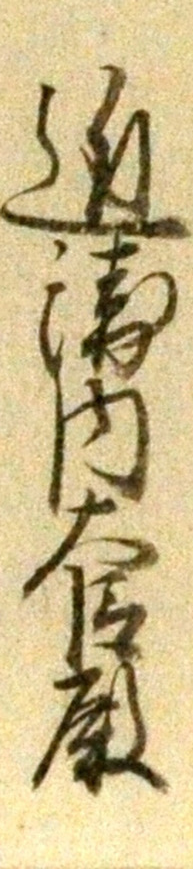近衛内大臣殿
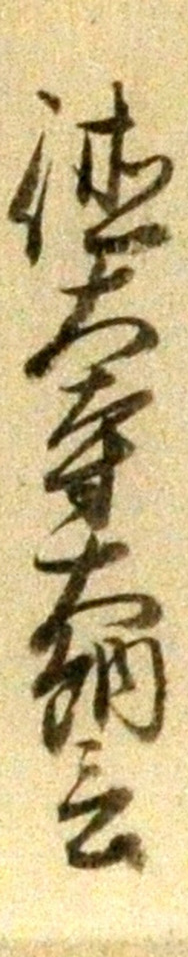徳大寺大納言
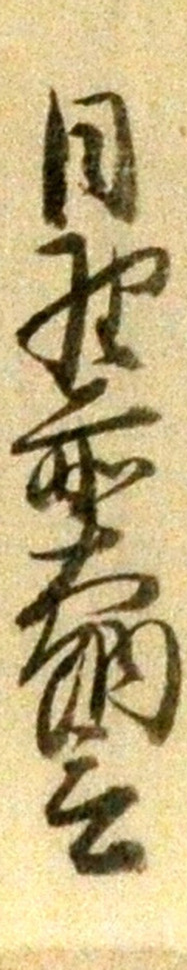日野前大納言
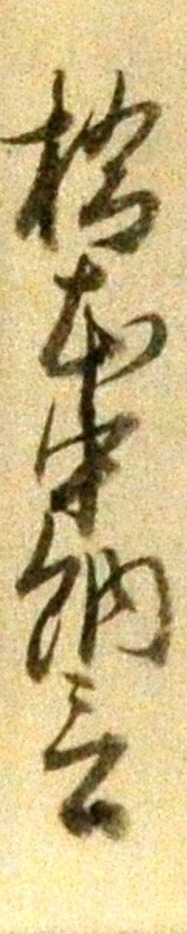橋本中納言
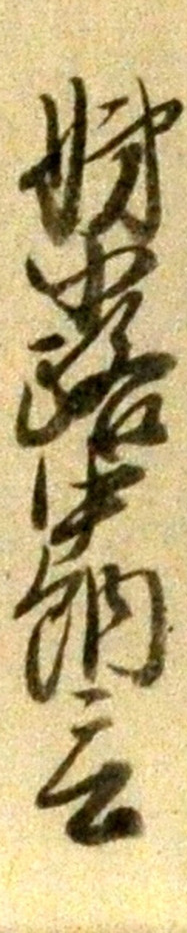姉小路中納言
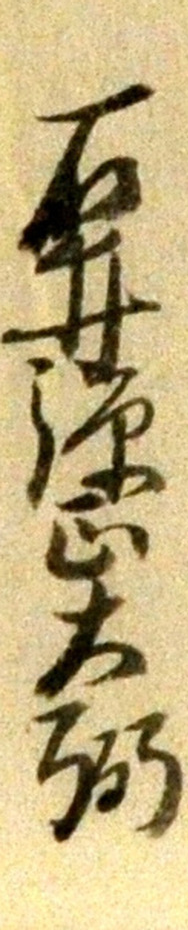石井弾正大弼
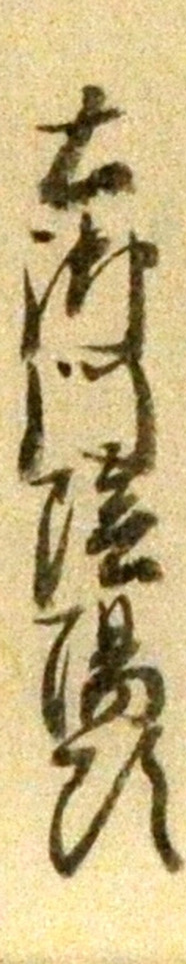土御門陰陽頭
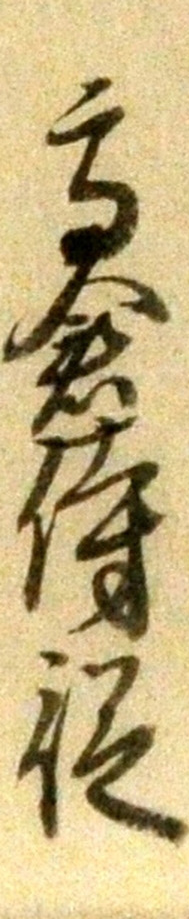高倉侍従
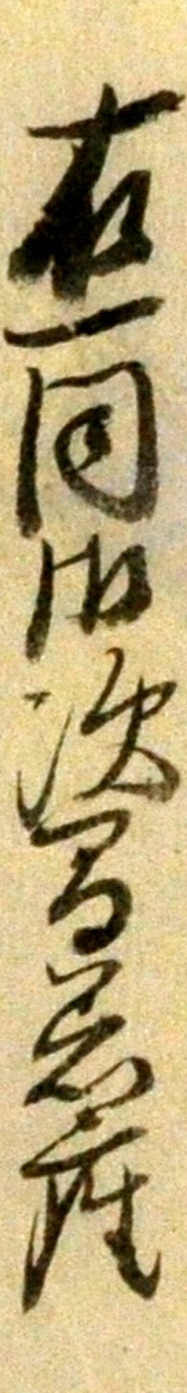右一同御次間着座
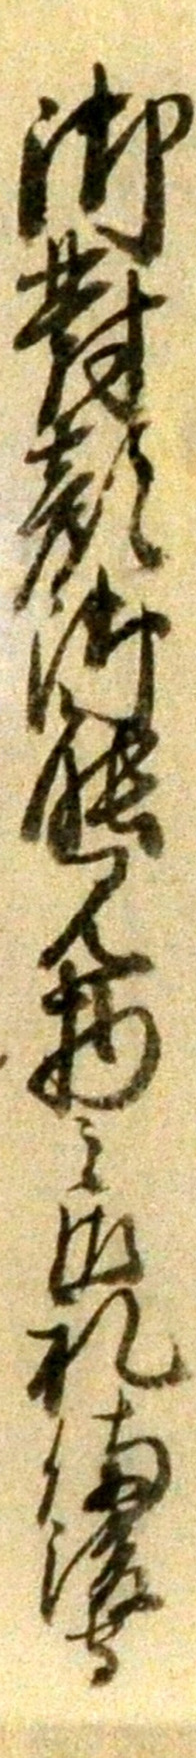御対顔御能見物之御礼備後守
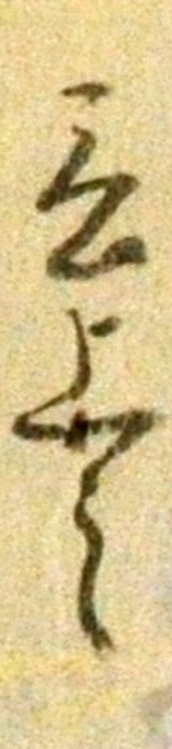言上之
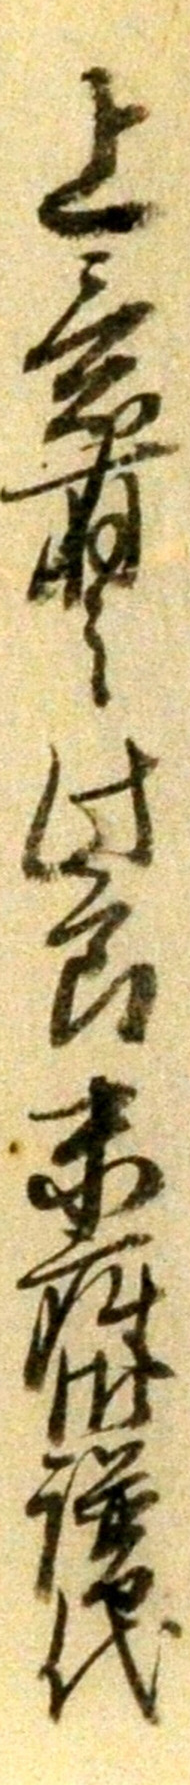上意有之此節末座御譜代
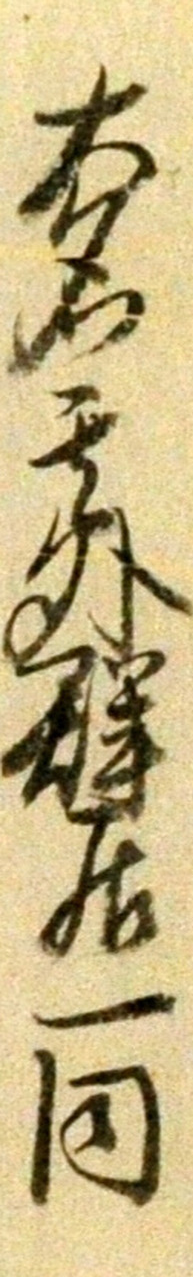大名其外群居一同
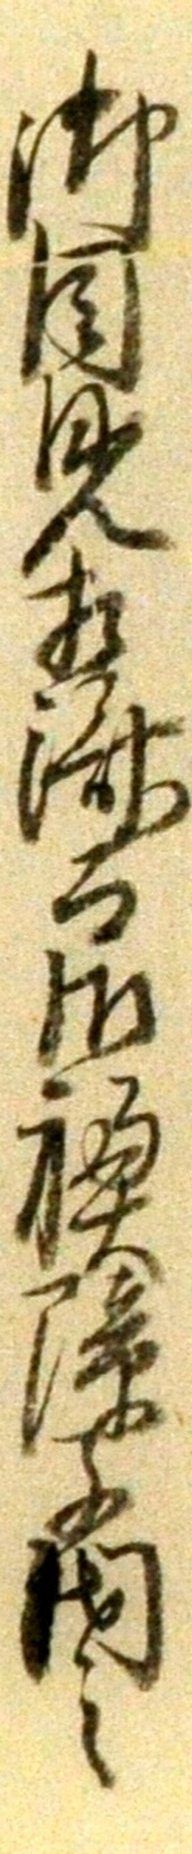御目見相済而御襖障子閉之
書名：御馳走御能ノ節ノ留外
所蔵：伊那市立高遠町図書館・合同会社AMANE
